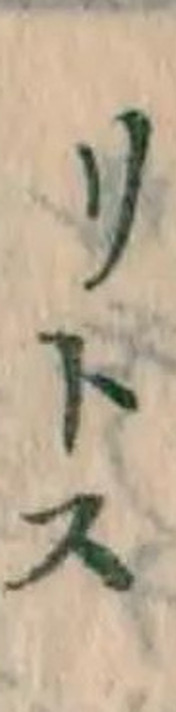リトス

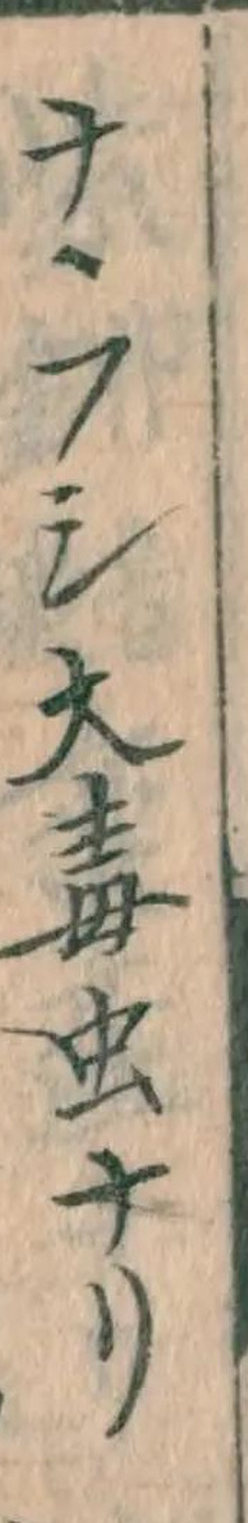ナヽフシ大毒虫ナリ
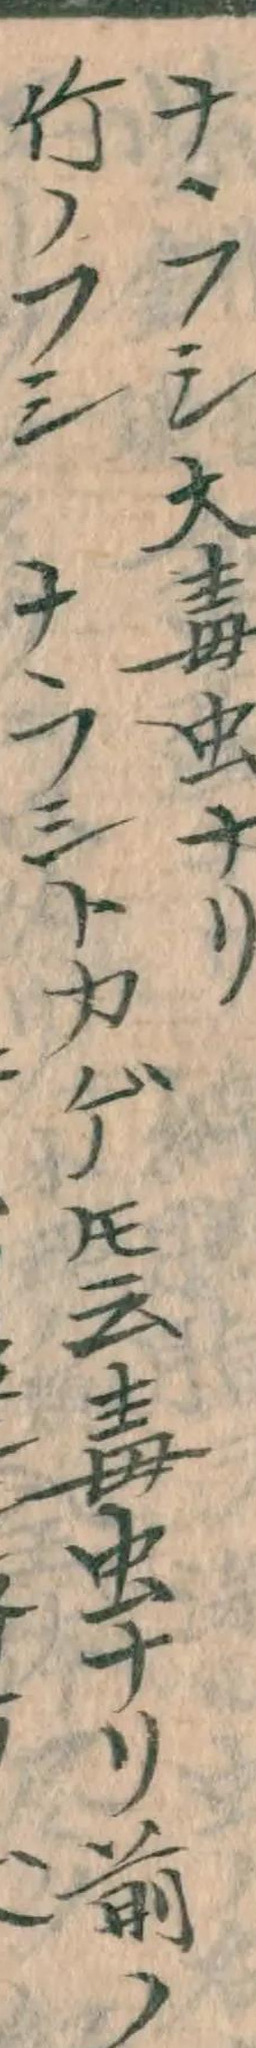竹ノフシナヽフシトカゲトモ云毒虫ナリ前ノ
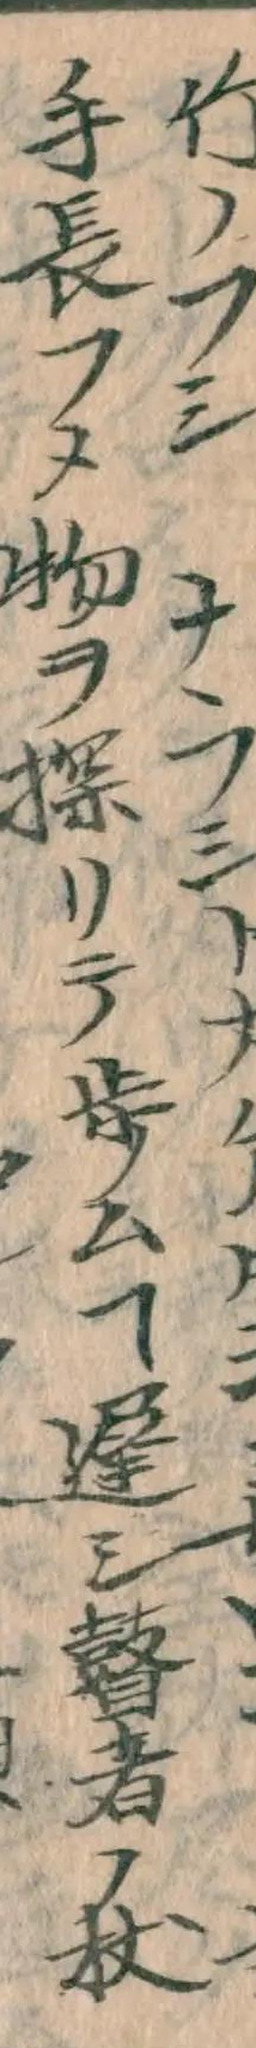手長フシテ物ヲ探リテ歩ムコト遅シ瞽者ノ杖
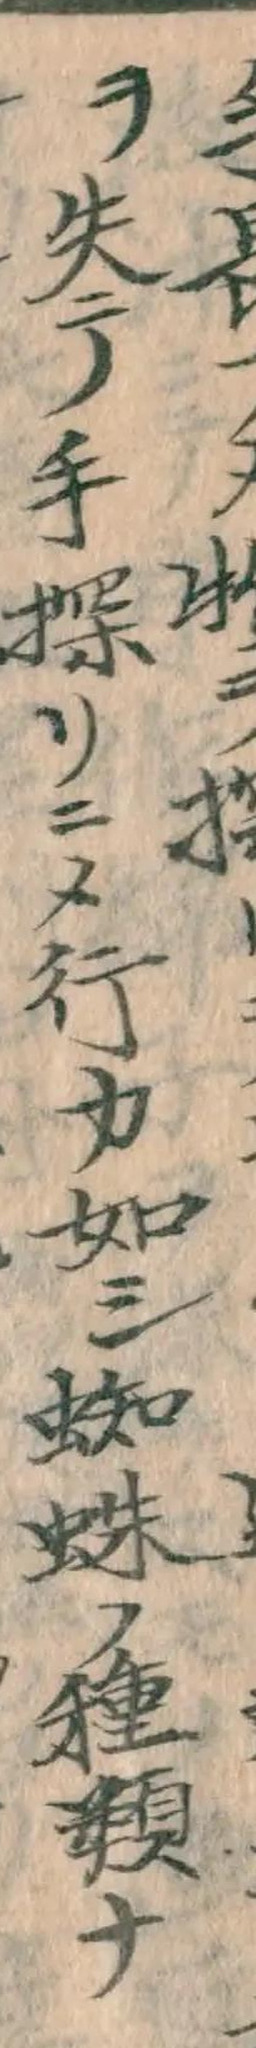ヲ失テ手探リニシテ行カ如シ蜘蛛ノ種類ナ
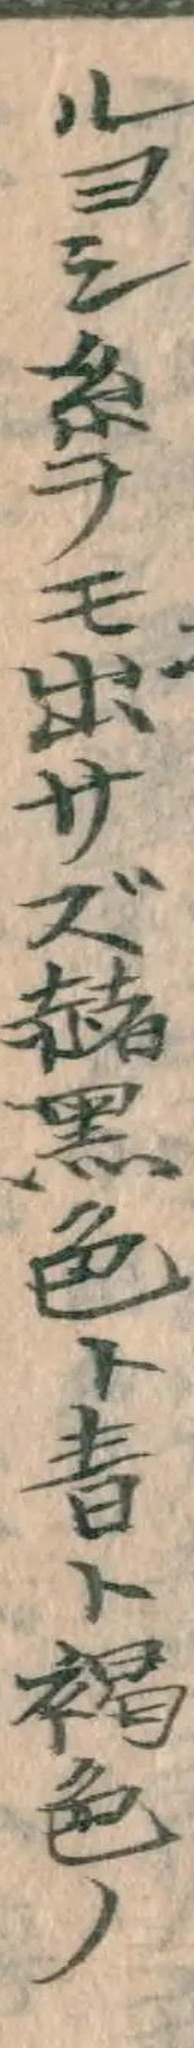ルヨシ糸ヲモ出サズ赭黒色ト青ト褐色ノ
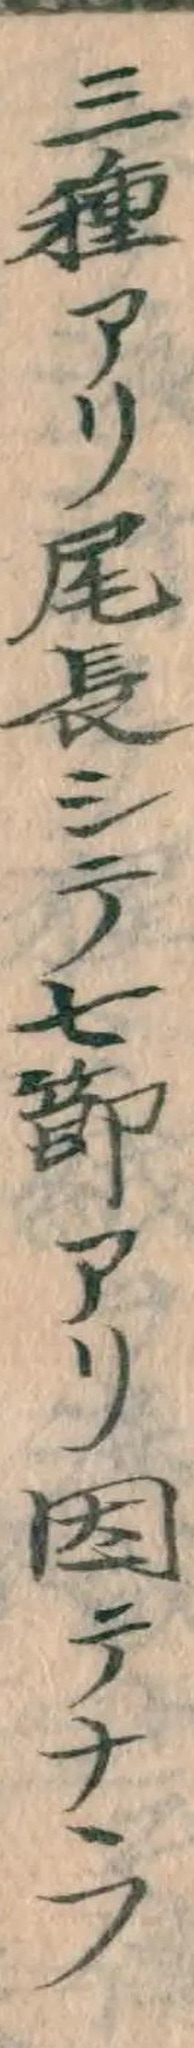三種アリ尾長シテ七節アリ因テナヽフ
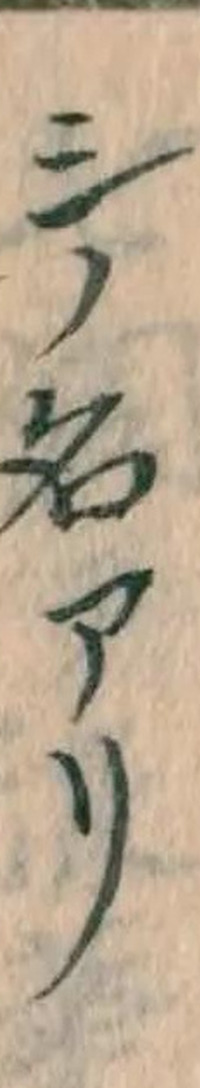シノ名アリ
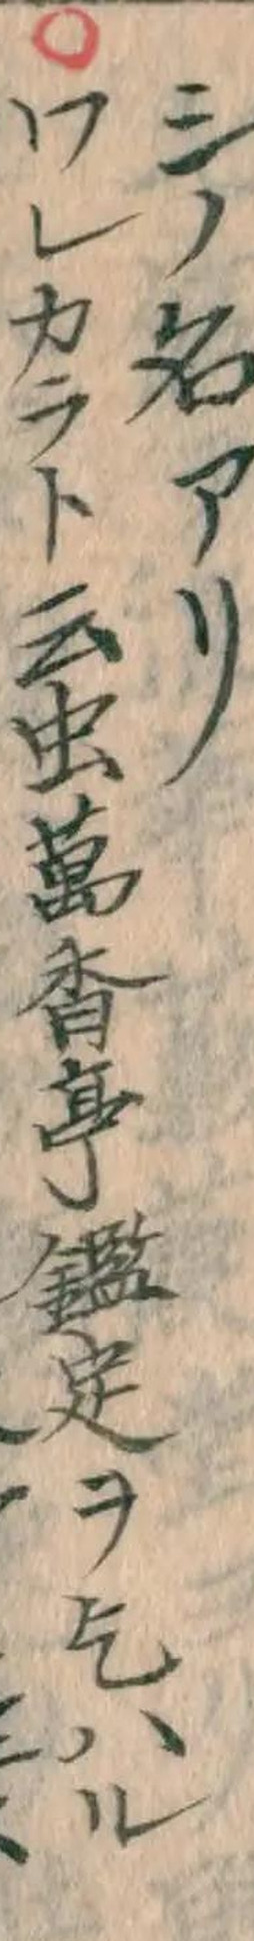◦ワレカラト云虫萬香亭鑑定ヲ乞ハル
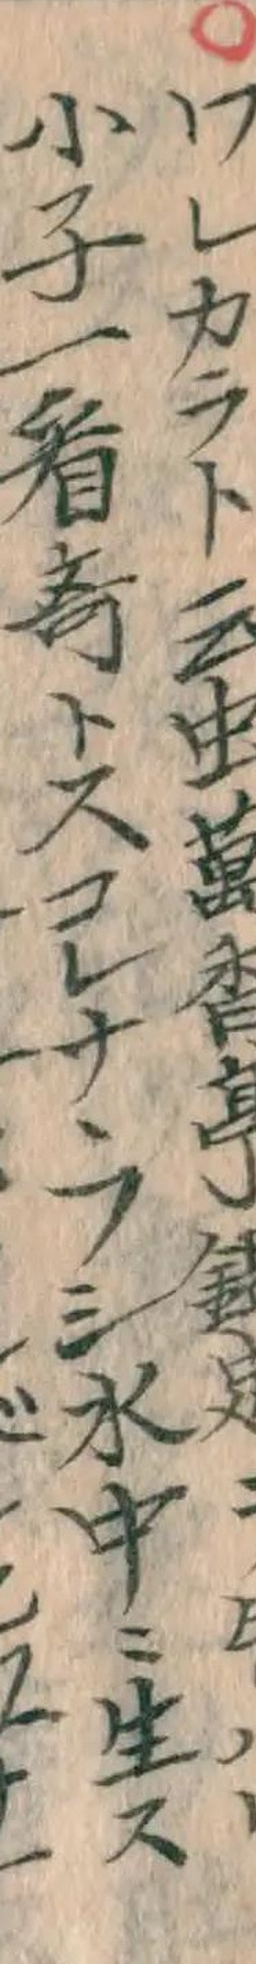小子一看奇トスコレナヽフシ水中ニ生ス
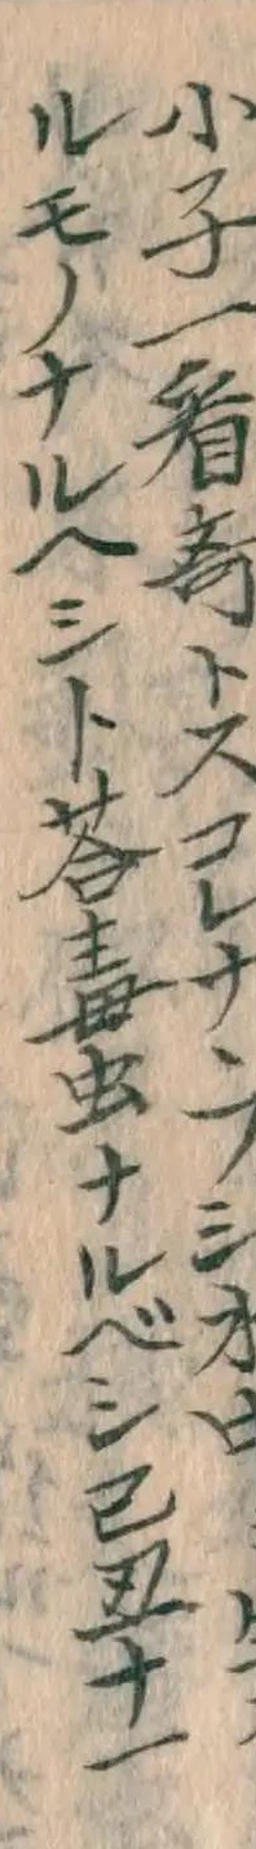ルモノナルヘシト答毒虫ナルベシ己丑十一
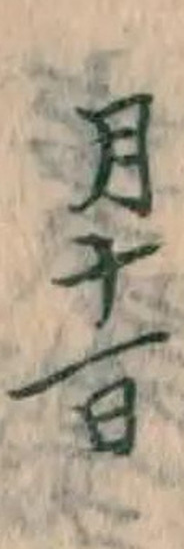月十一日
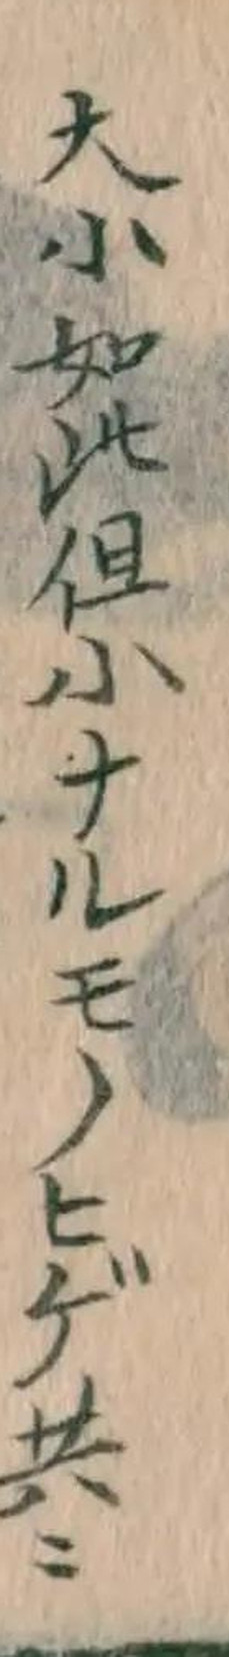大小如此但小ナルモノヒゲ共ニ
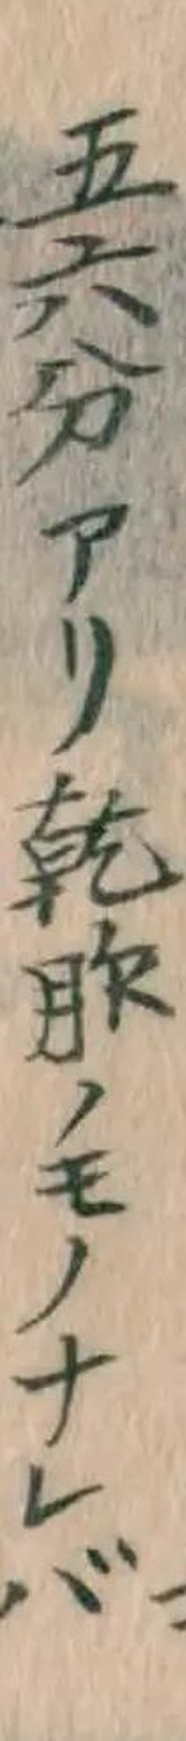五六分アリ乾胙ノモノナレバ
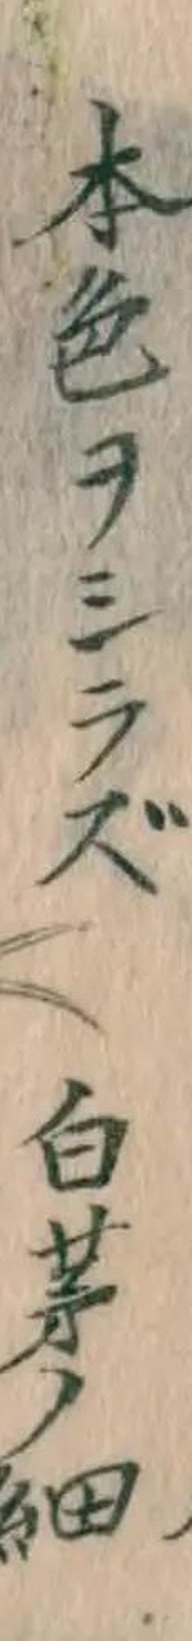本色ヲシラズ白茅ノ細
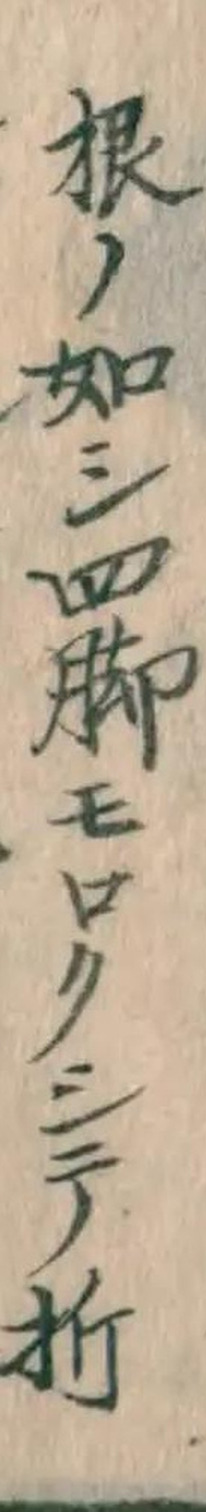根ノ如シ四脚モロクシテ折
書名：千蟲譜 3巻. [3]
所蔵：国立国会図書館 National Diet Library, JAPAN
